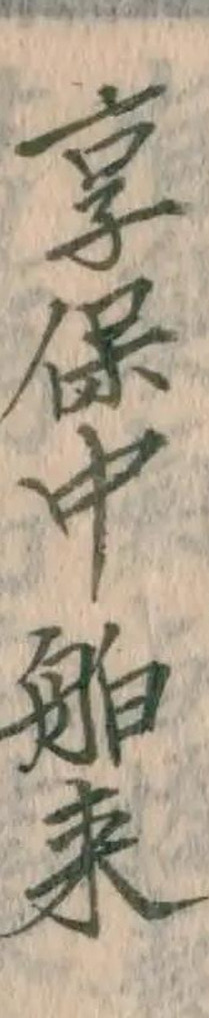享保中舶来
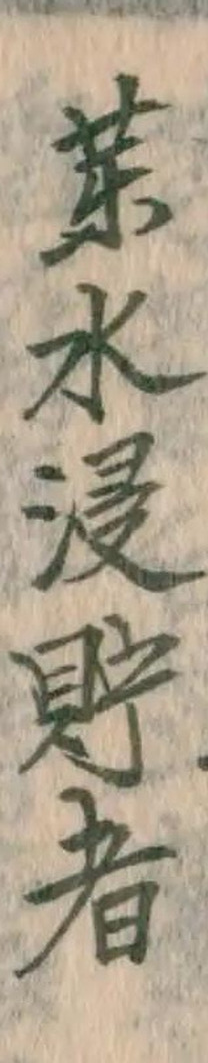薬水浸貯者

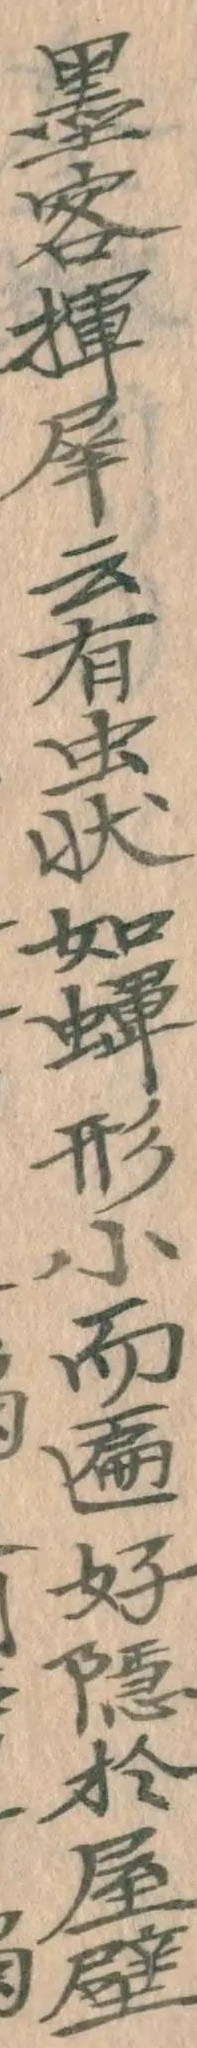墨客揮犀云有虫状如蝉形小而匾好隠於屋壁
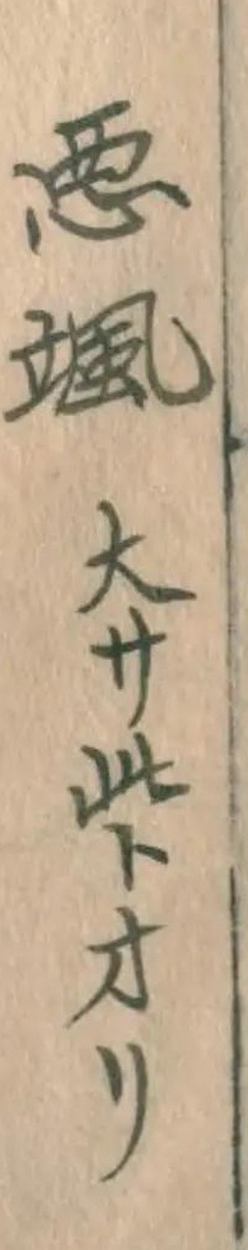悪颯大サ此トオリ
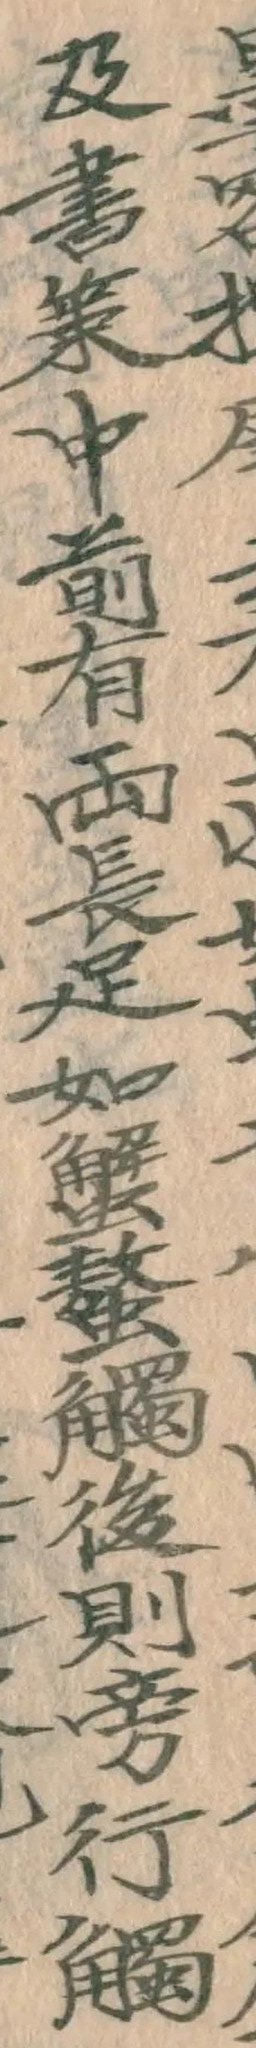及書策中前有両長足如蟹螯触後則旁行触
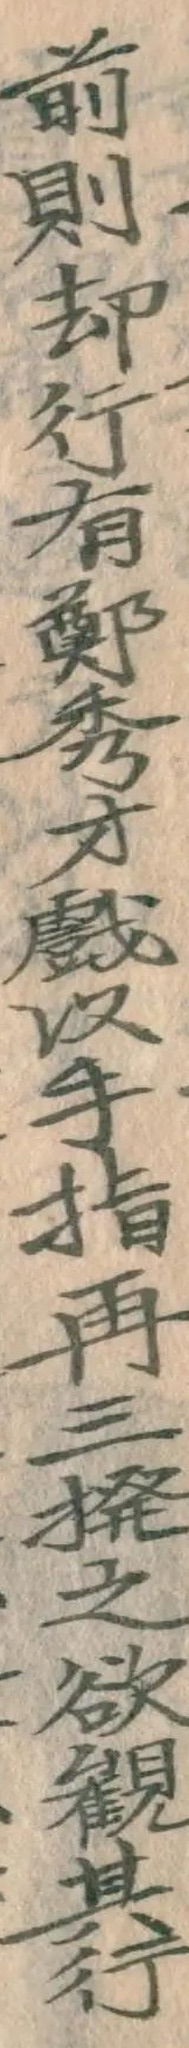前則却行有鄭秀才戯以手指再三𫝼之欲観其行
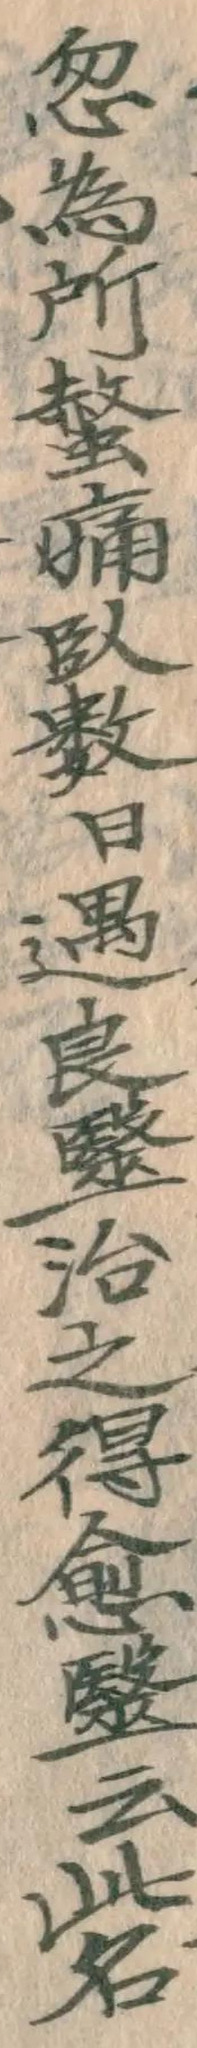忽為所螫痛臥数日遇良毉治之得愈毉云此名
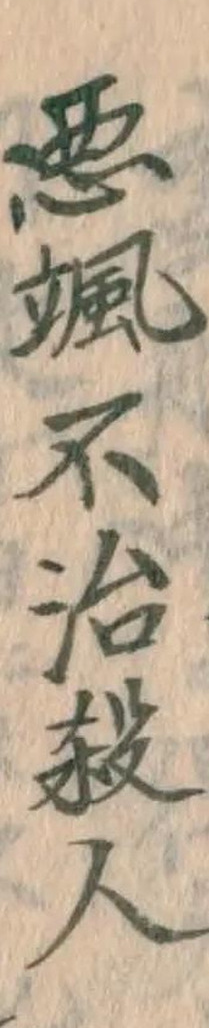悪颯不治殺人
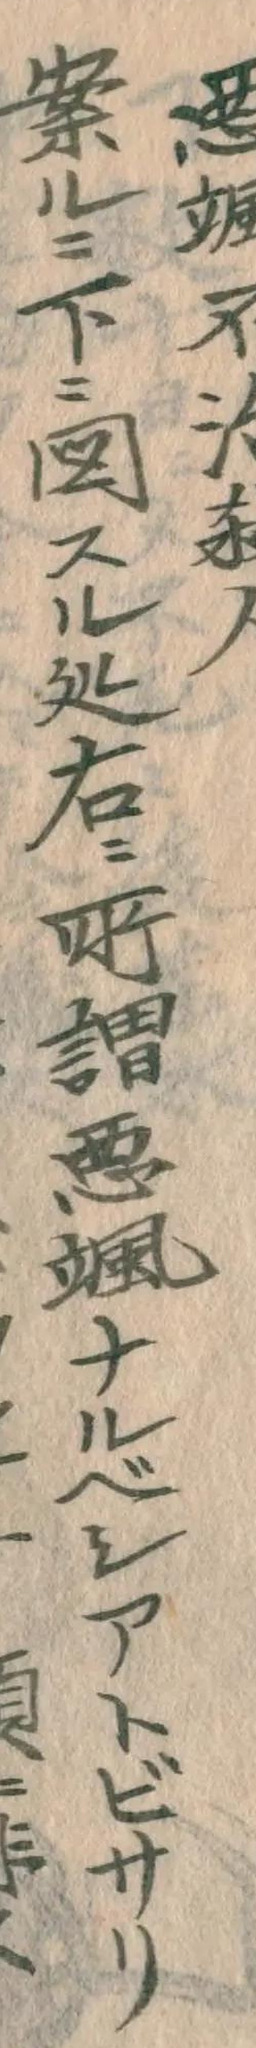案ルニ下ニ図スル処右ニ所謂悪颯ナルベシアトビサリ
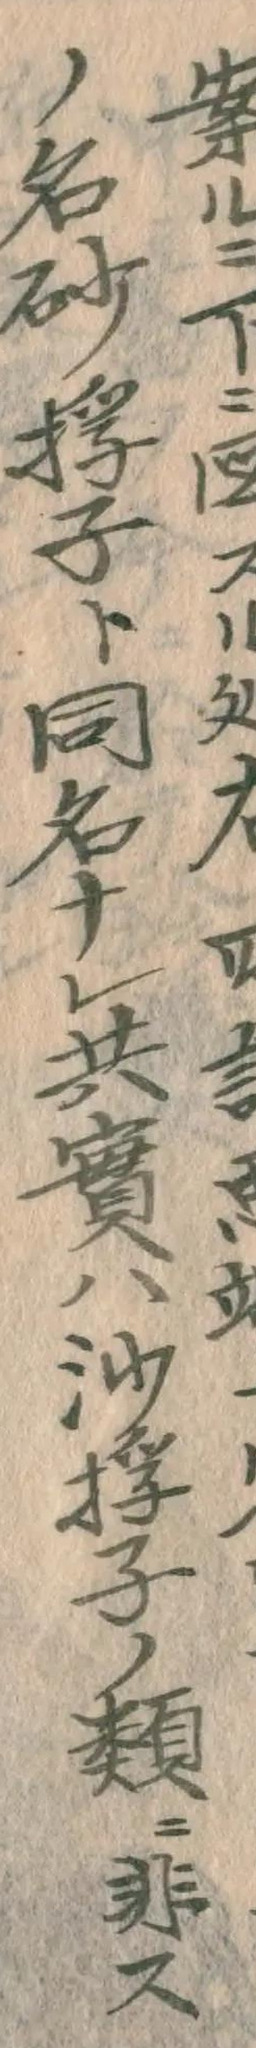ノ名砂捊子ト同名ナレ共実ハ沙捊子ノ類ニ非ス
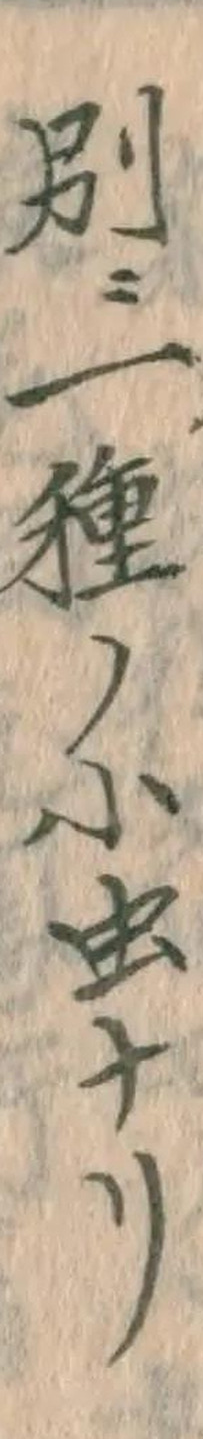別ニ一種ノ小虫ナリ
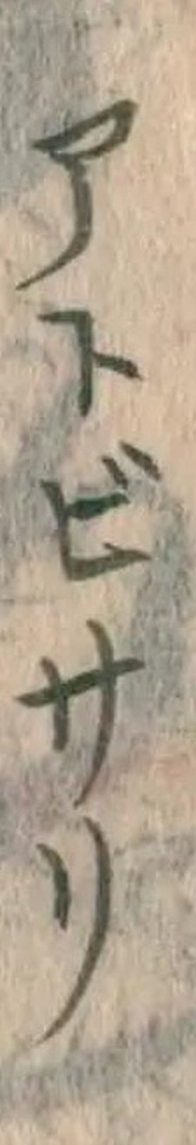アトビサリ
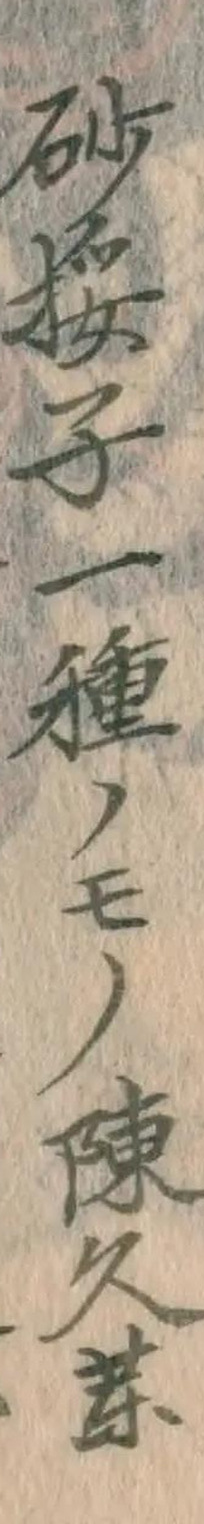砂挼子一種ノモノ陳久薬
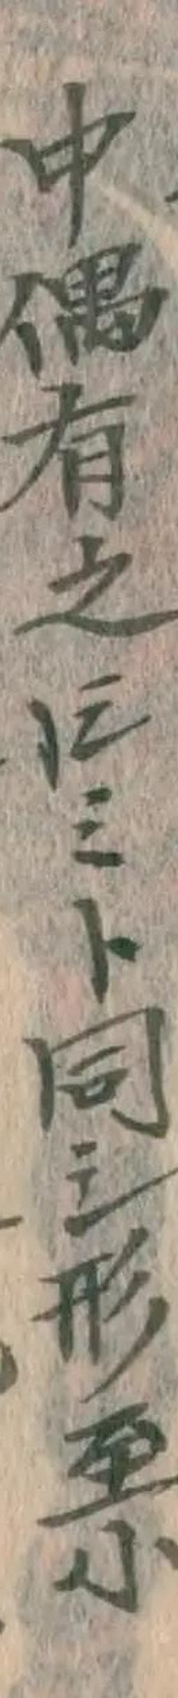中偶有之ミト同シ形至小
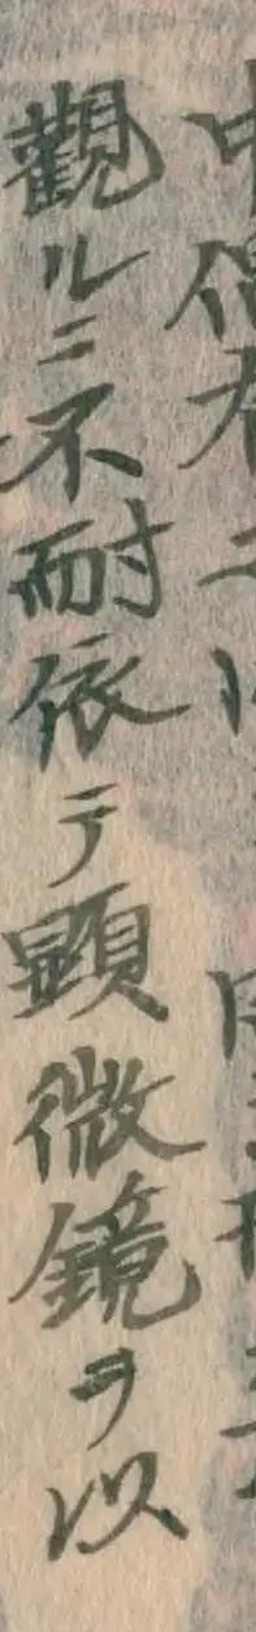観ルニ不耐依テ顕微鏡ヲ以
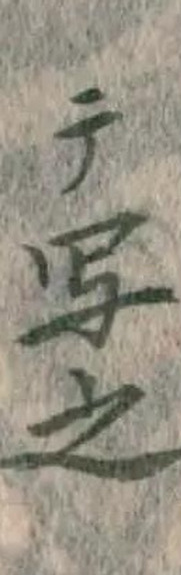テ写之
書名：千蟲譜 3巻. [3]
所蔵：国立国会図書館 National Diet Library, JAPAN
